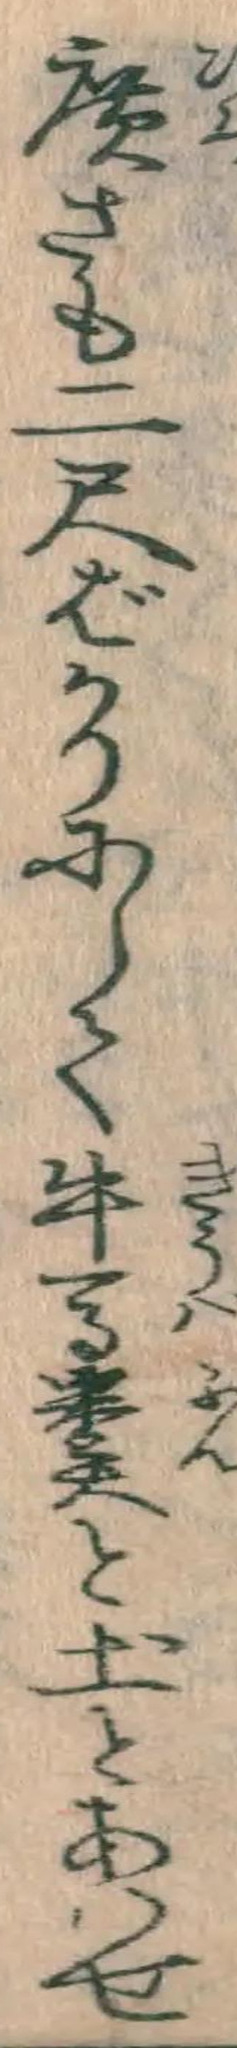広さも二尺ばかりにして牛馬糞と土とあはせ
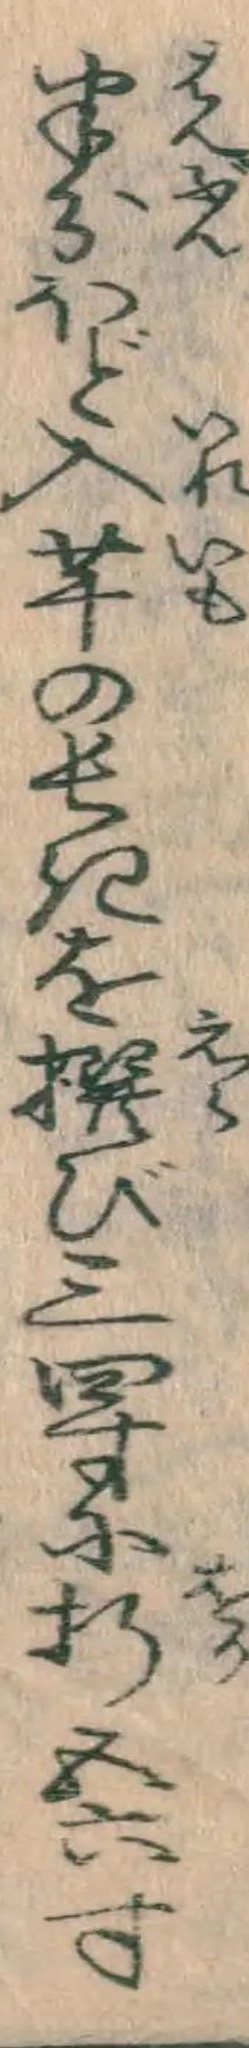半分ほど入芋の長きを撰び三四寸に折五六寸
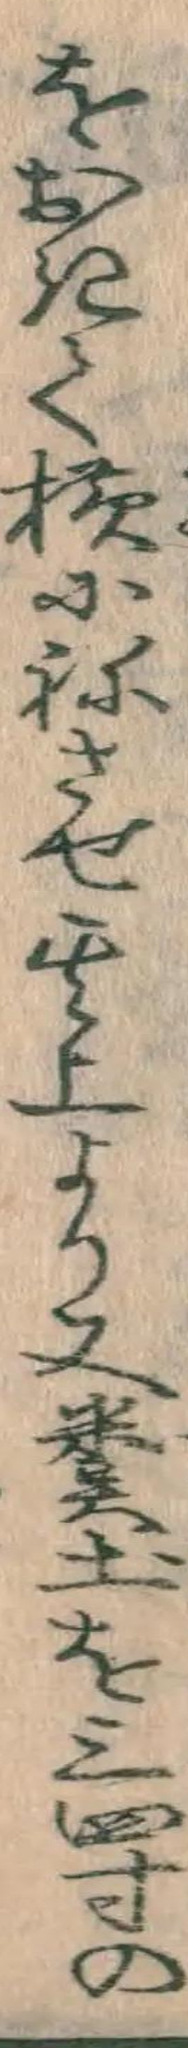をおきて横にねさせ其上より又糞土を三四寸の
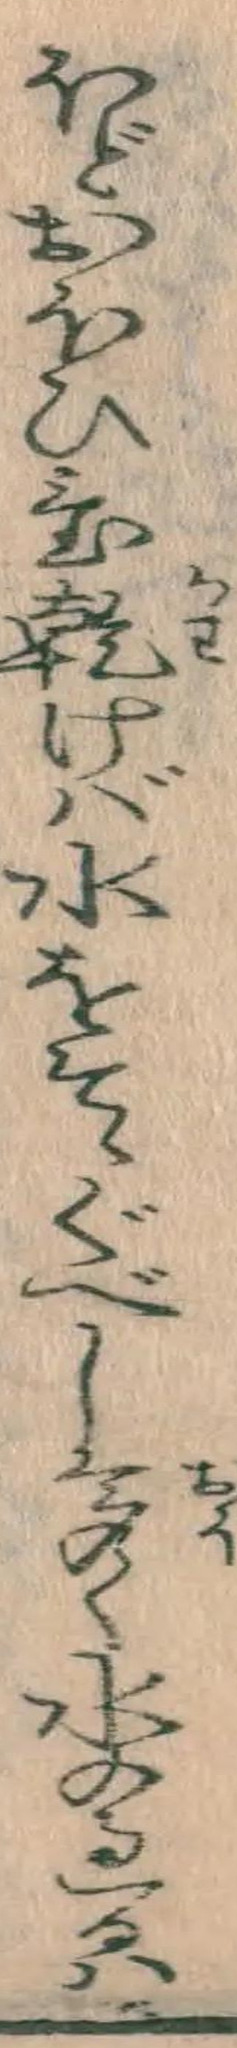ほどおほひ置乾けば水をそゝぐべし多く水の過るは
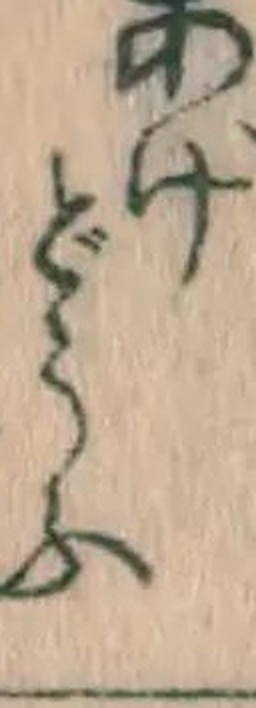どうふ
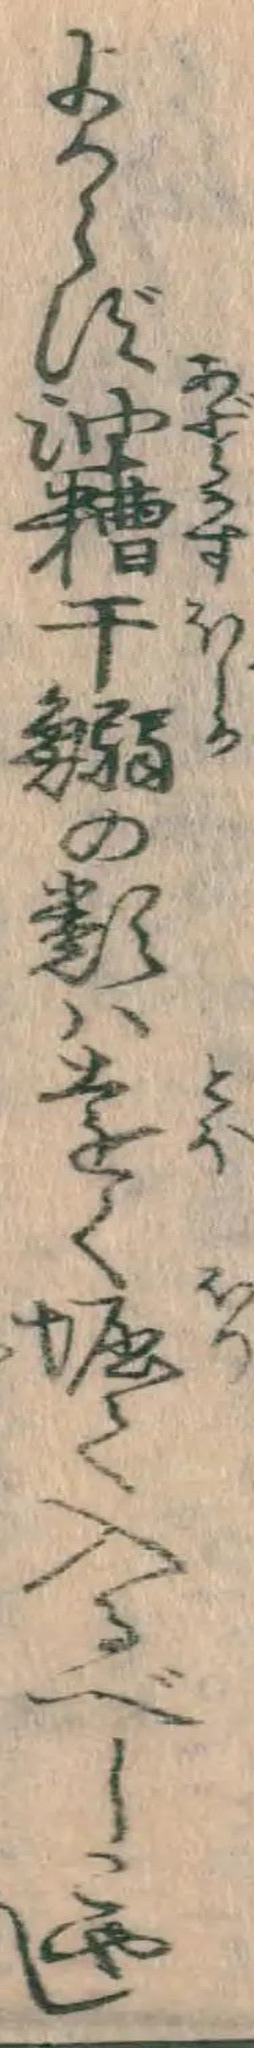よからず油糟干鰯の類は遠く掘て入るべしこやし
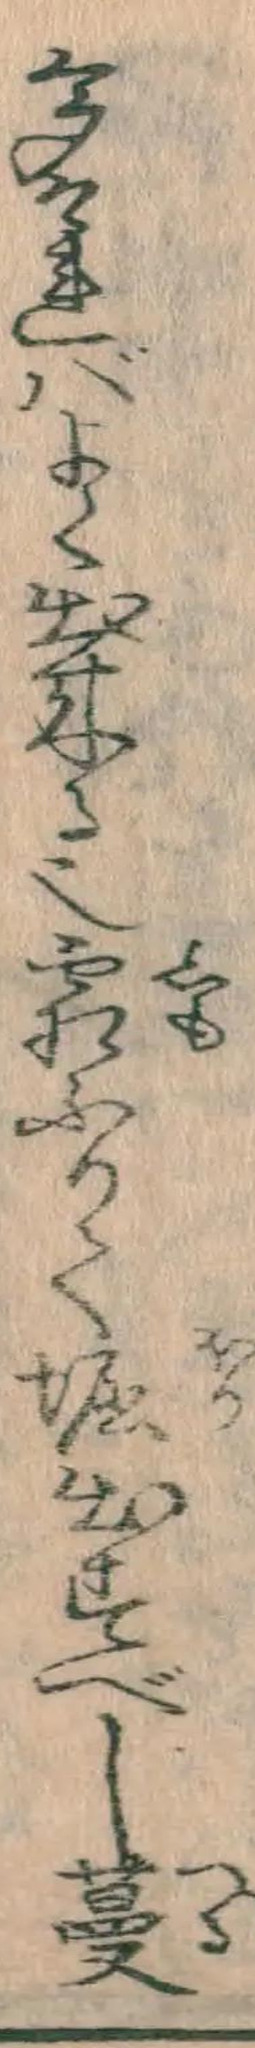多ければよく出来る也霜ふりて掘出すべし蔓
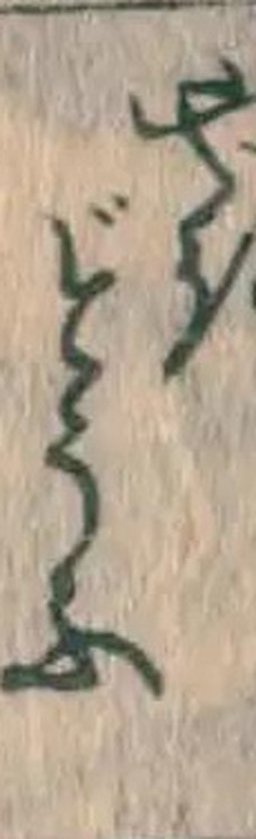どうふ
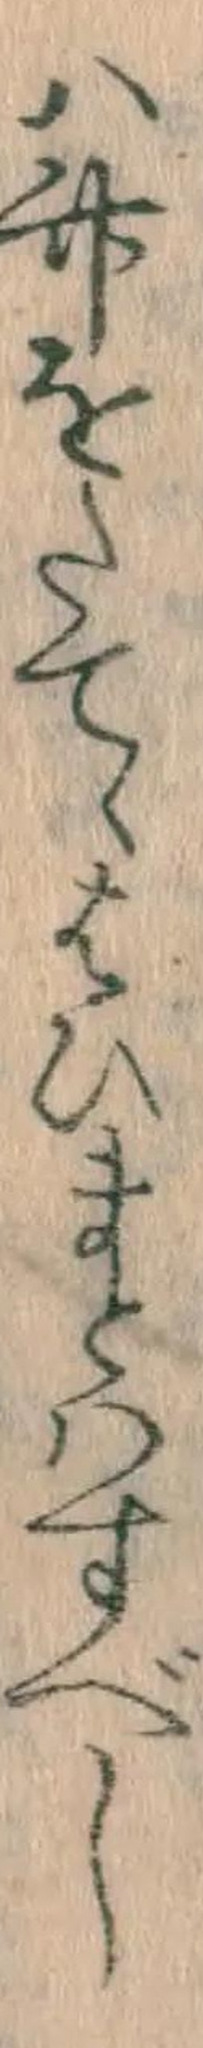は竹をたてゝはひまとはすべし
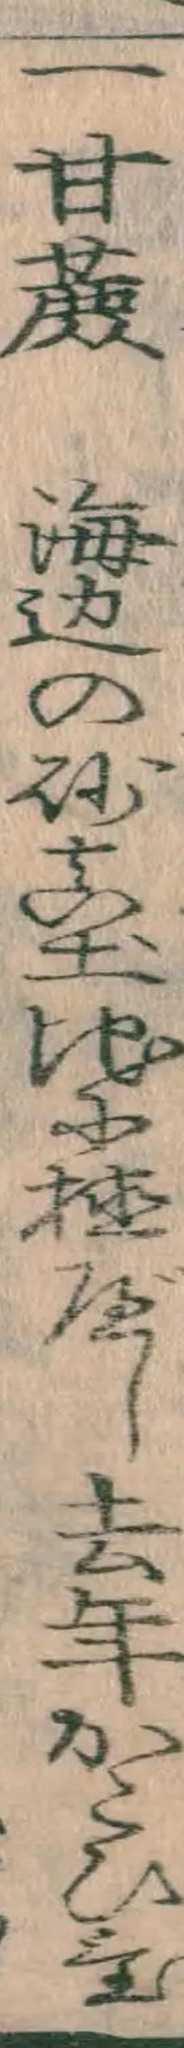一甘蔗海辺の砂真土地に植べし去年かこひ置
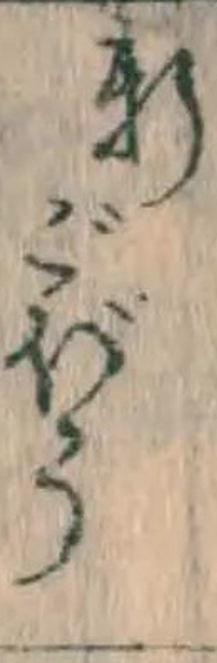ごぼう
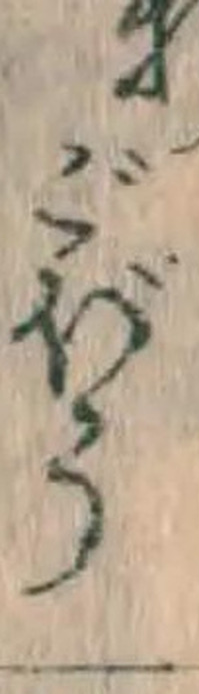ごぼう
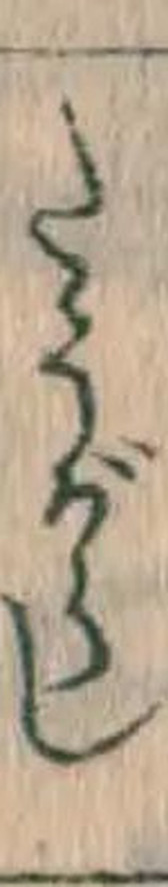とうがらし
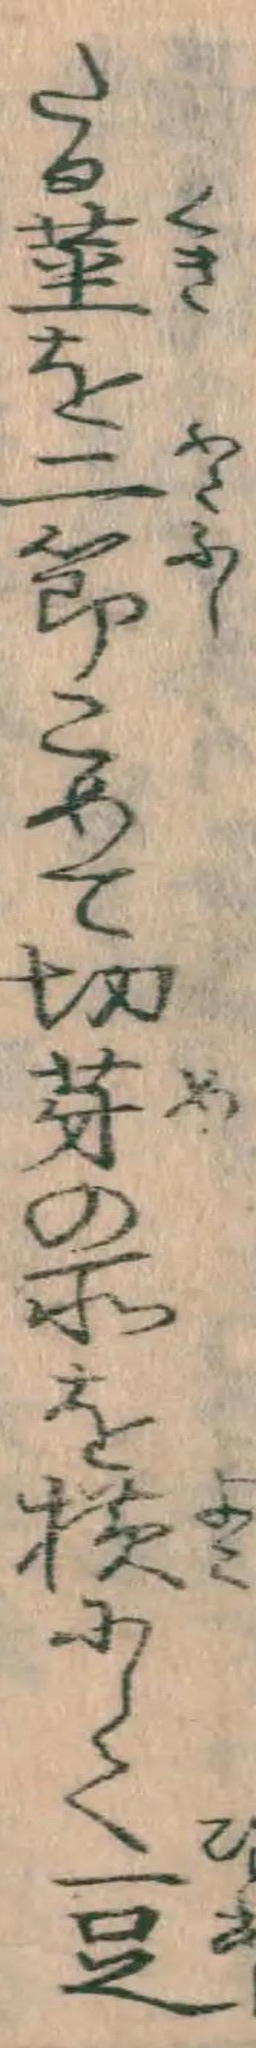たる茎を二節こめて切芽の所を横にして一足
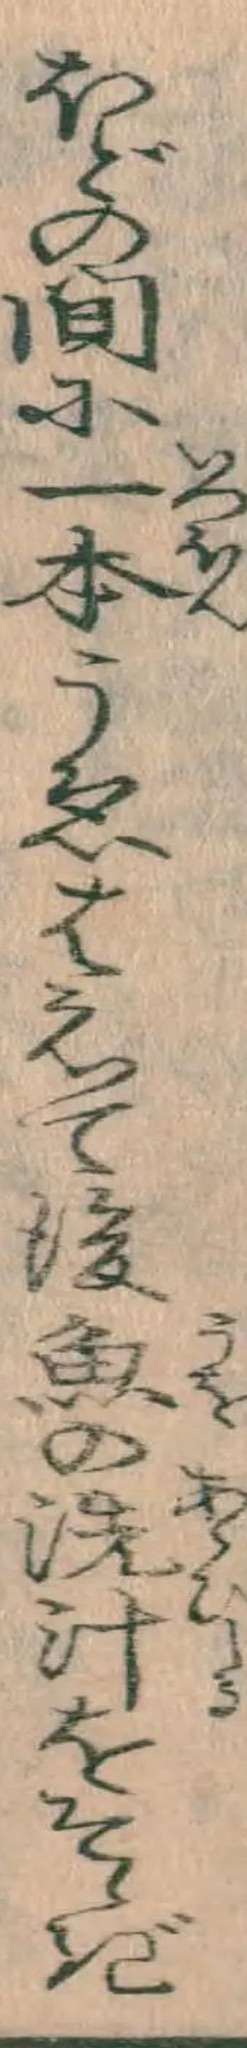ほどの間に一本うゑはえて後魚の洗汁をそゝぎ
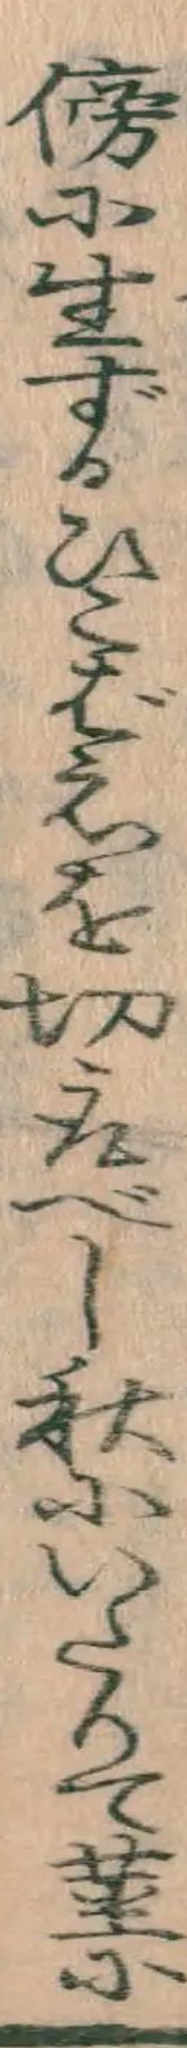傍に生ずるひこばえを切取べし秋にいたりて茎に
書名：広益秘事大全 3巻. [5]
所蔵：国立国会図書館 National Diet Library, JAPAN
